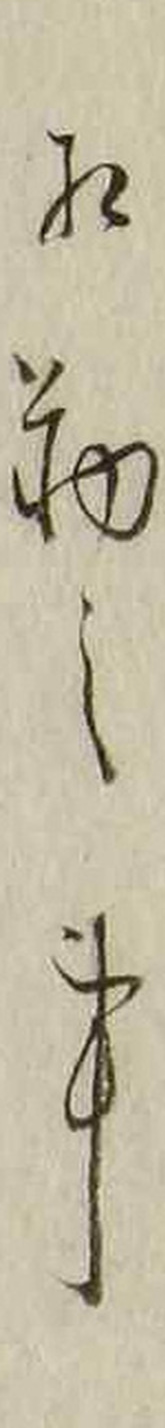相勤之事
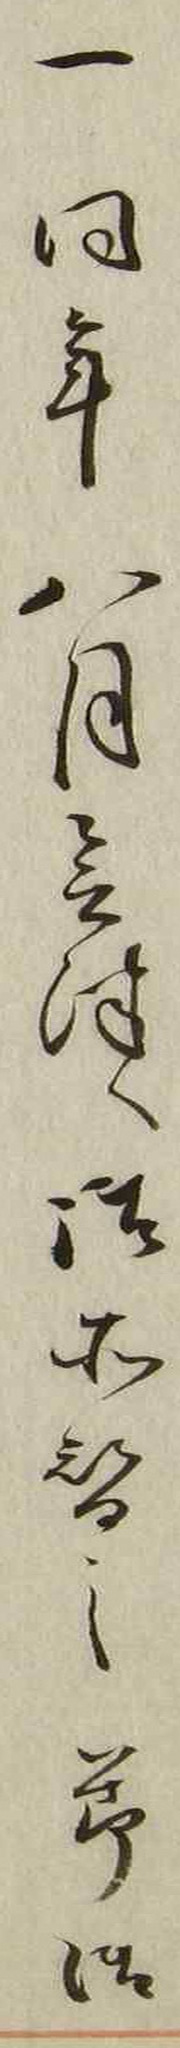一同年八月会津へ御所替之節御
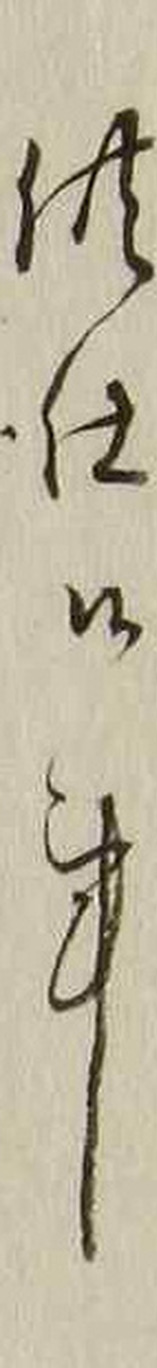供仕候事
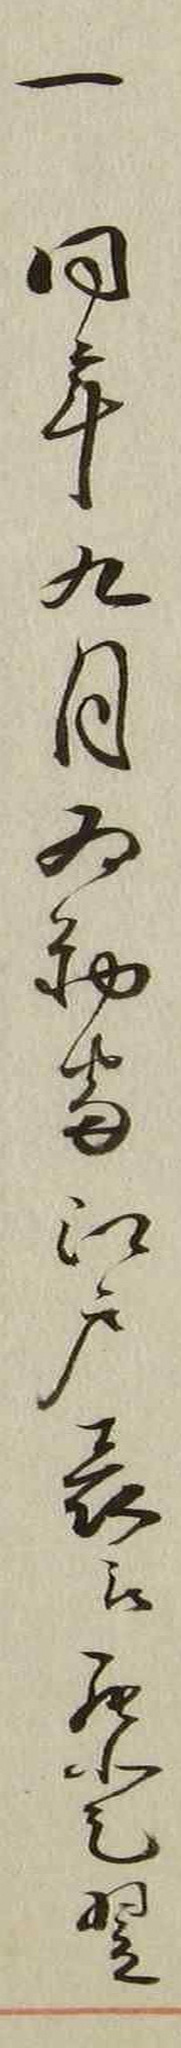一同年九月為勤番江戸表江罷登翌
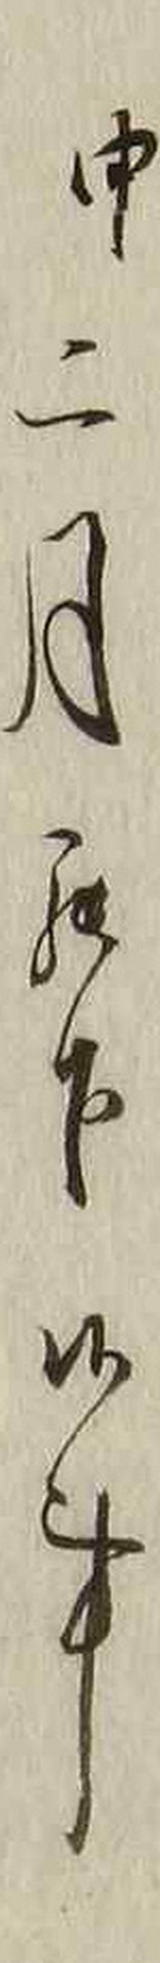申二月罷下候事
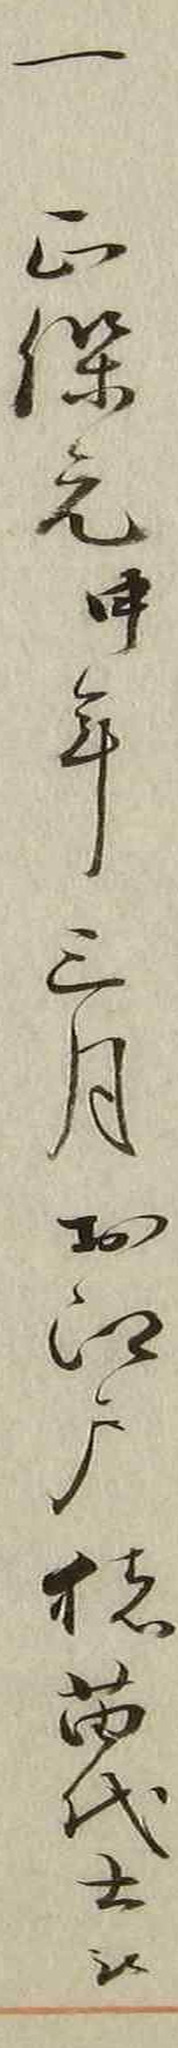一正保元申年三月於江戸猪苗代士被
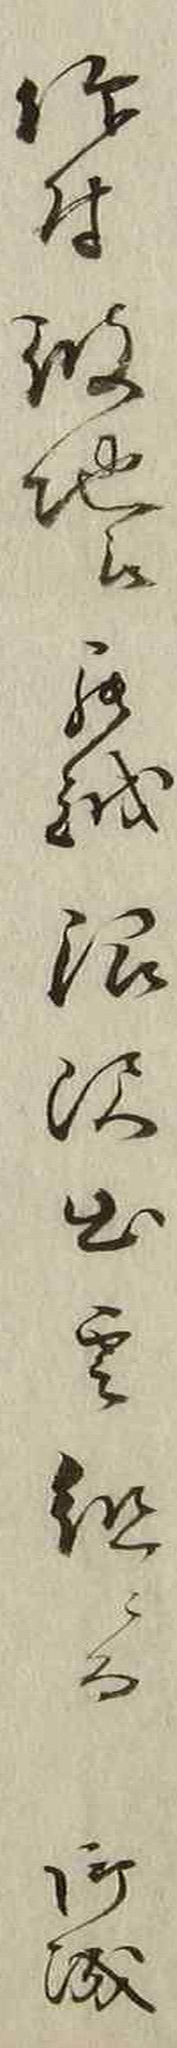仰付彼地江罷越沼沢出雲組ニ而御城
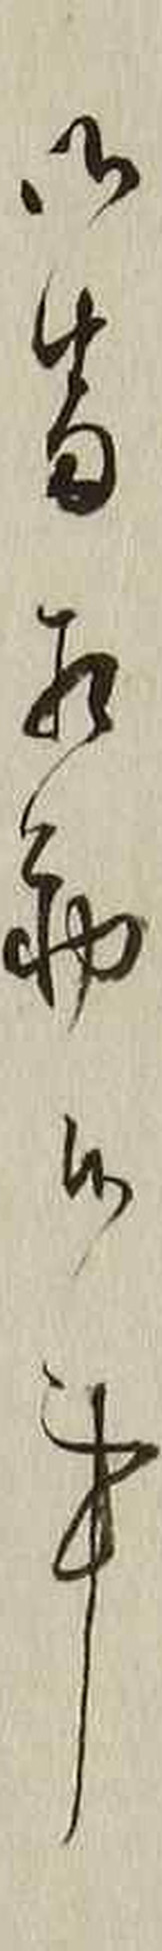御番相勤候事
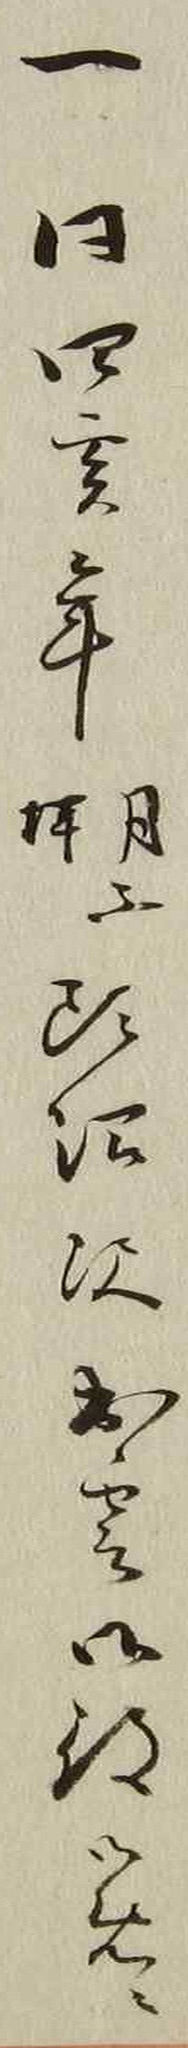一同四亥年月不詳頭沼沢出雲御役御免ニ
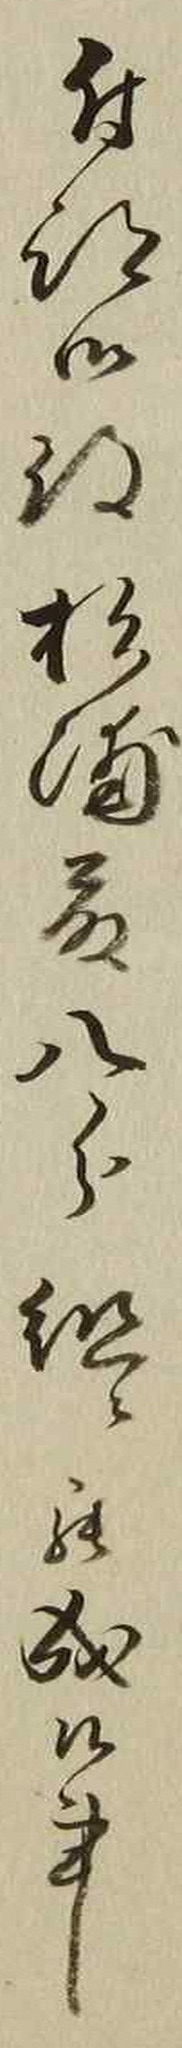付跡御役杉浦藤八郎組ニ罷成候事
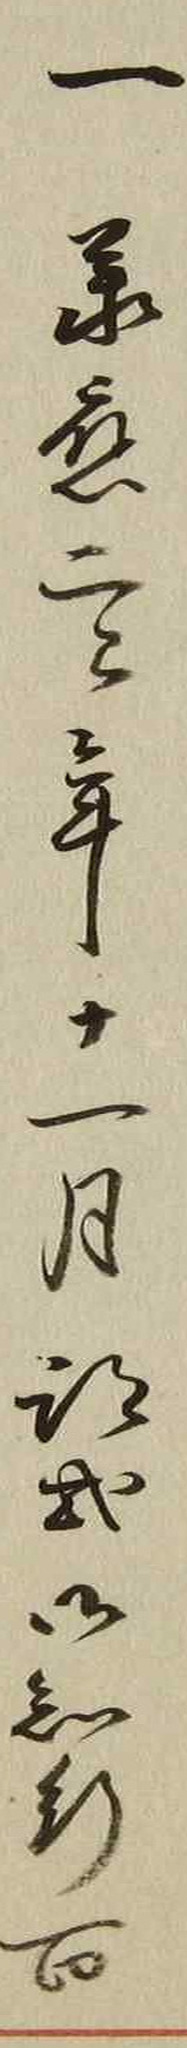一承応二巳年十一月跡式御知行百
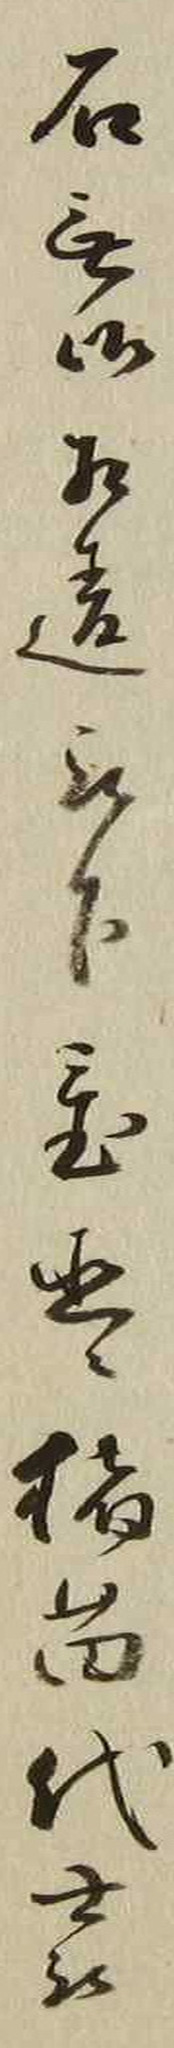石無御相違被下置直ニ猪苗代士被
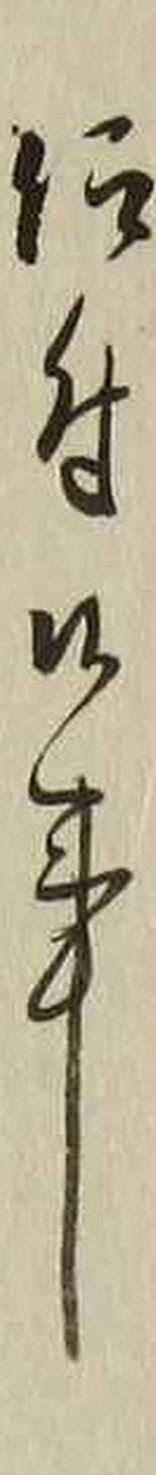仰付候事
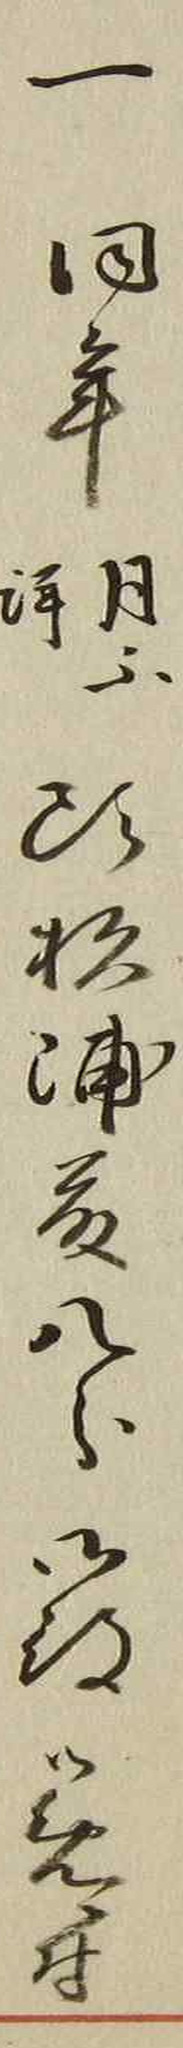一同年月不詳頭杉浦藤八郎御役御免ニ付
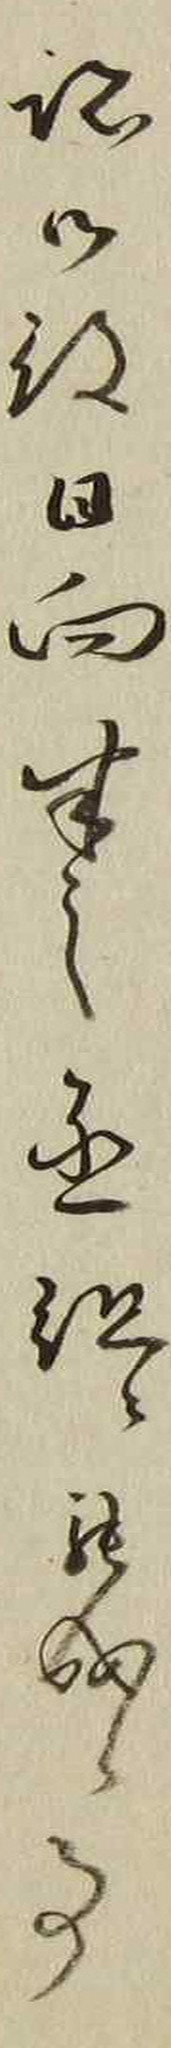跡御役日向半之丞組ニ罷成候事
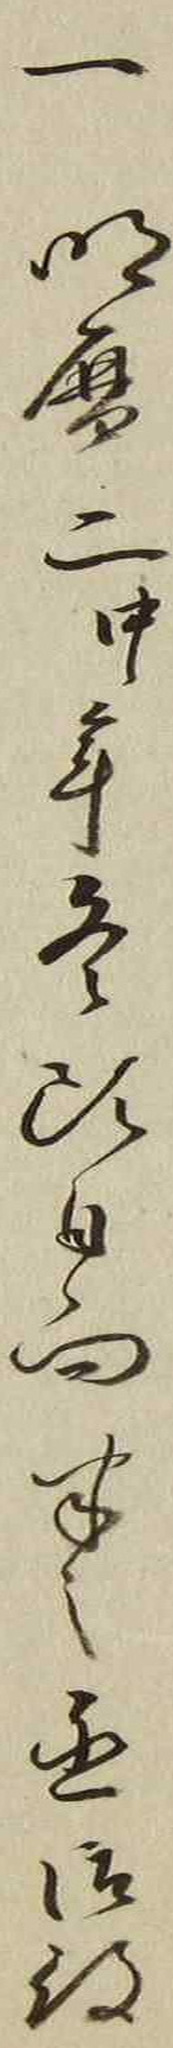一明暦二申年冬頭日向半之丞御役
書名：諸士系譜　巻之26　い之部26
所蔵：会津若松市立会津図書館
